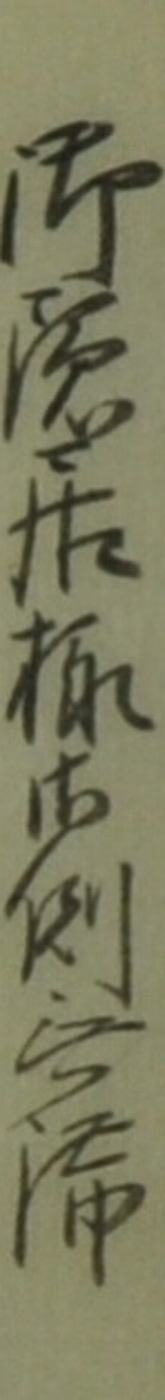御隠居様御側無滞
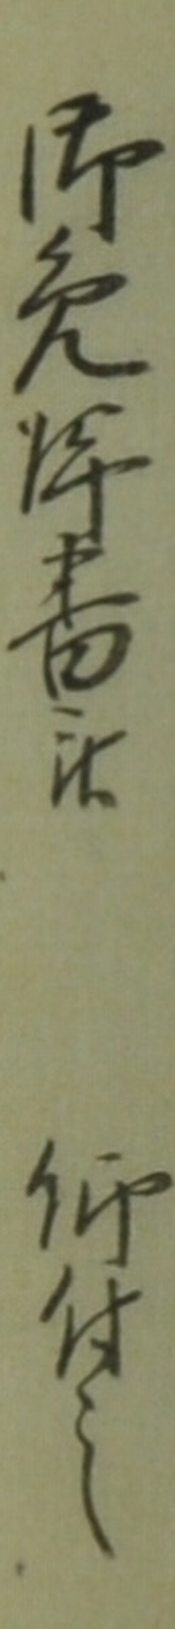御免帰番被仰付之
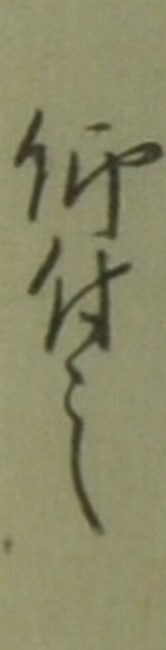仰付之

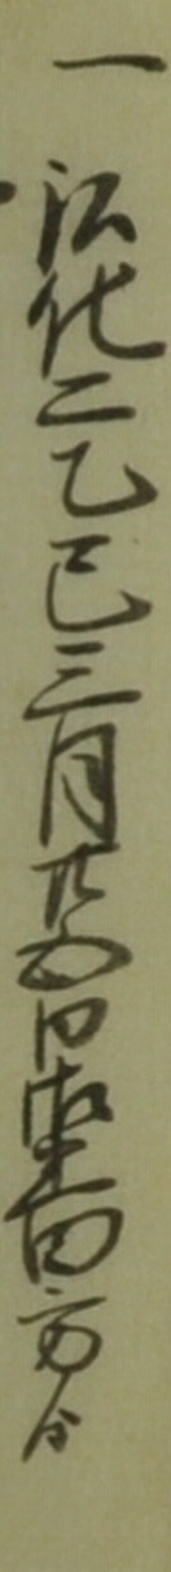一弘化二乙巳三月廿五日御番方ゟ
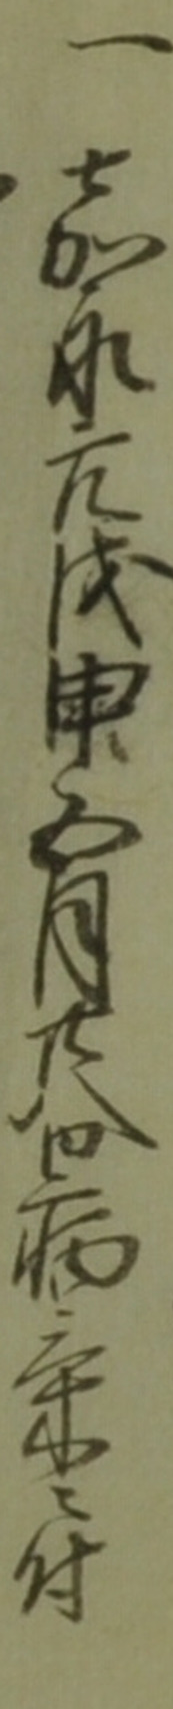一嘉永元戊申五月廿八日病気ニ付
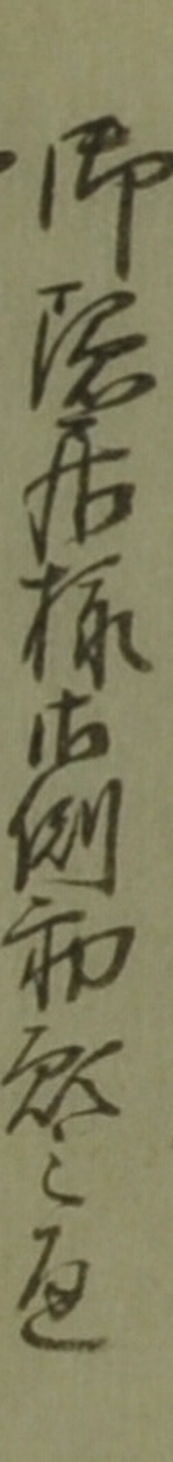御隠居様御側勤願之通
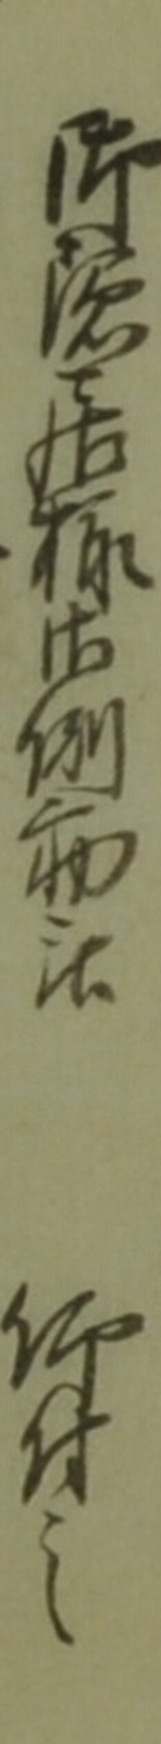御隠居様御側勤被仰付之
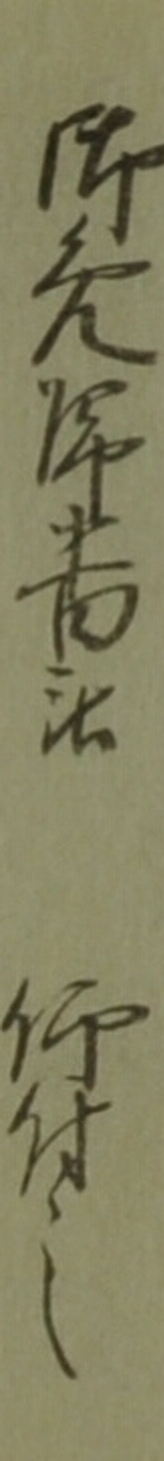御免帰番被仰付之
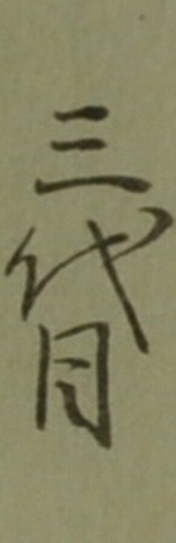三代目
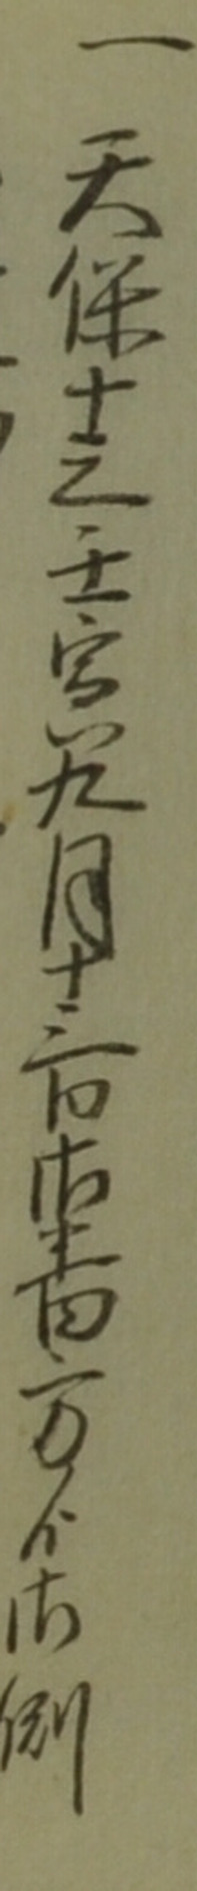一天保十三壬寅九月十三日御番方ゟ御側
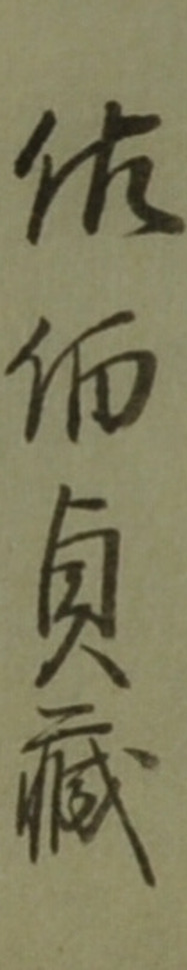佐伯貞蔵
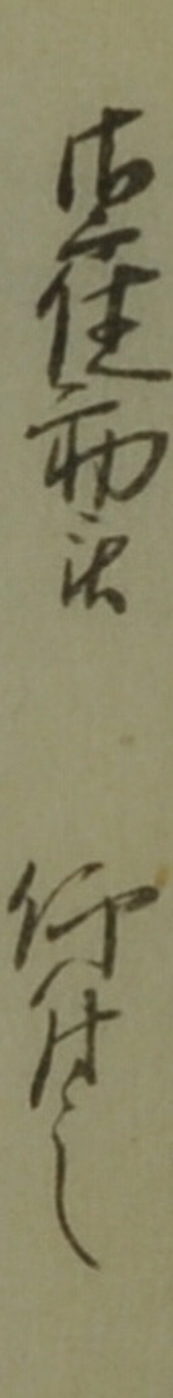御雇勤被仰付之
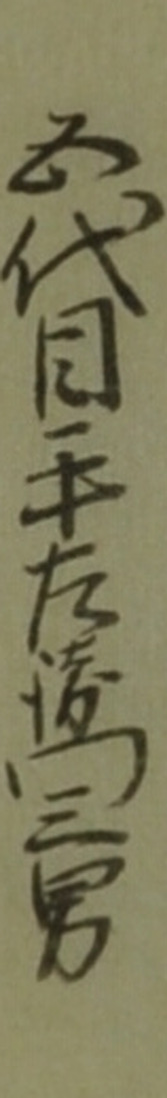五代目平左衛門三男
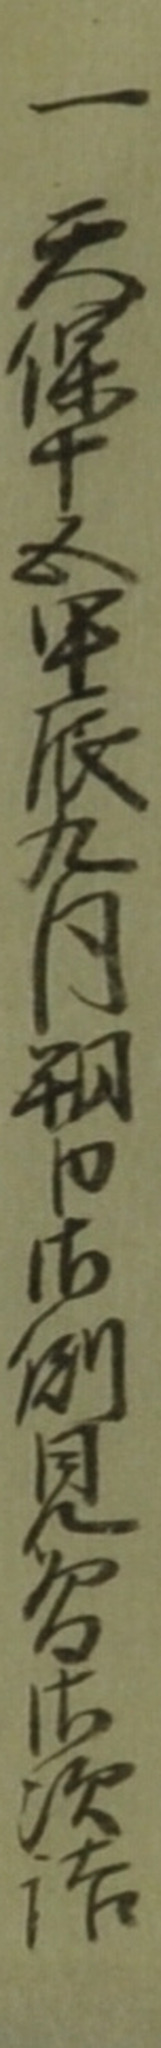一天保十五甲辰九月朔日御側見習御次詰
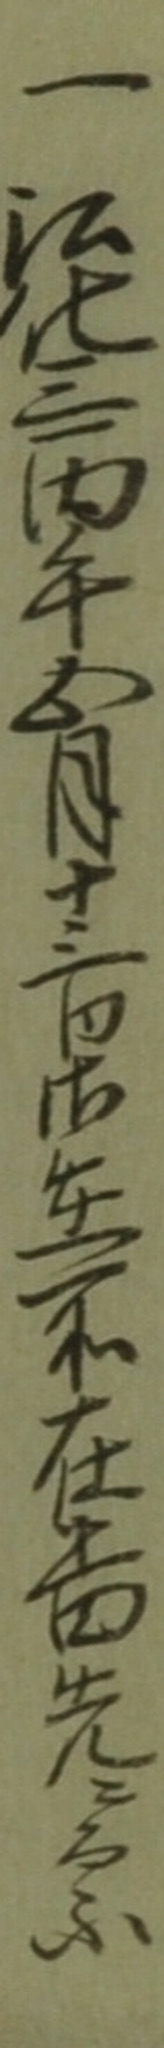一弘化三丙午五月十三日御在所在番先ニ而不
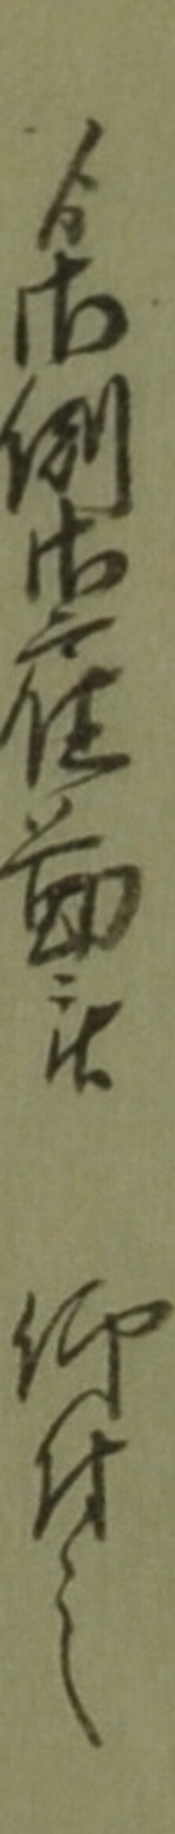御側御雇勤被仰付之
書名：諸御役代々録（五）
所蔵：伊那市立高遠町図書館・合同会社AMANE
